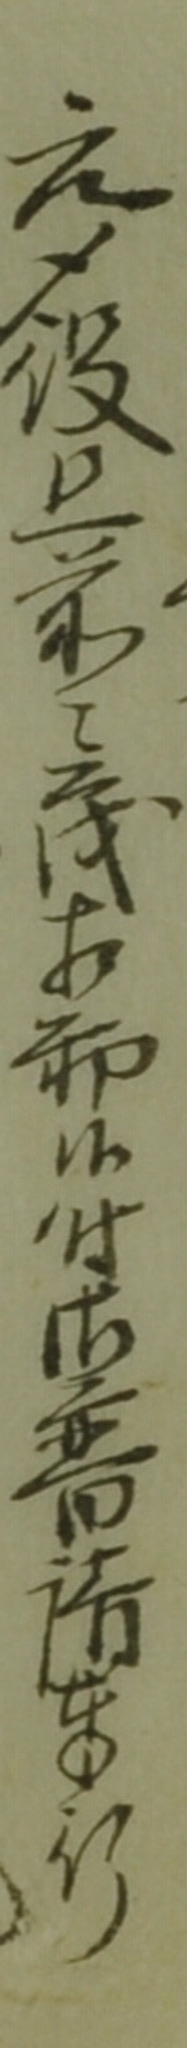元〆役且前々茂相勤候付御普請奉行
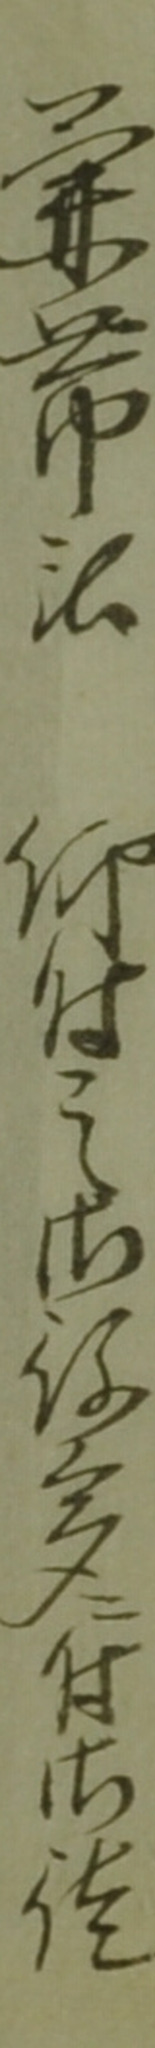兼帯被仰付之御役多付御徒
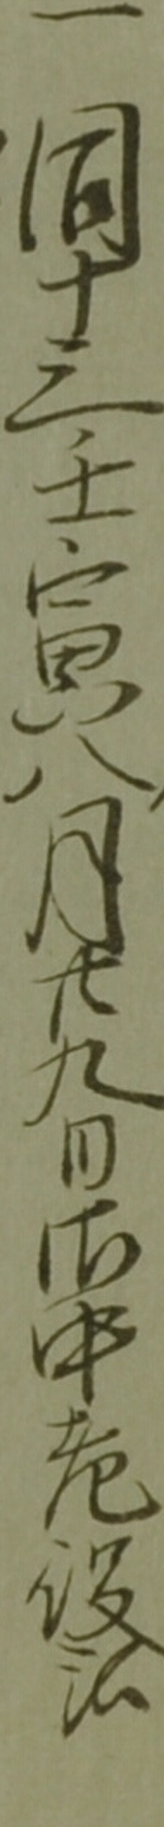一同十三壬寅八月廿九日御中老役被
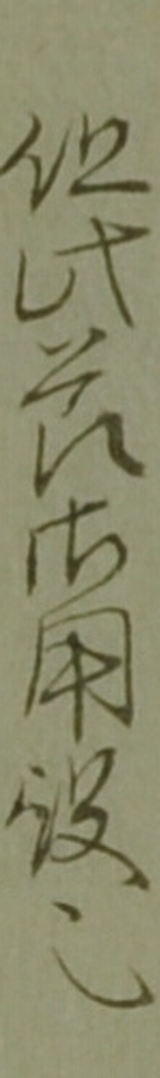但此節御用役也
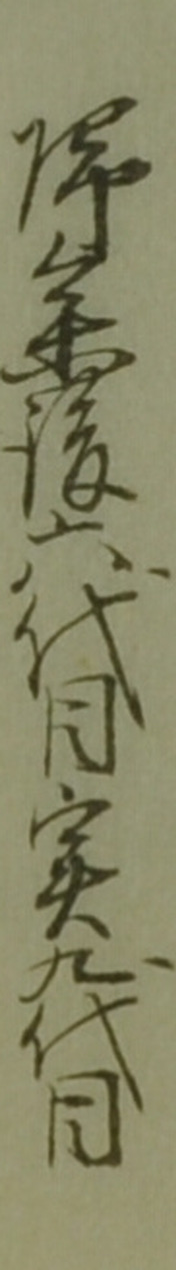帰参後六代目実九代目
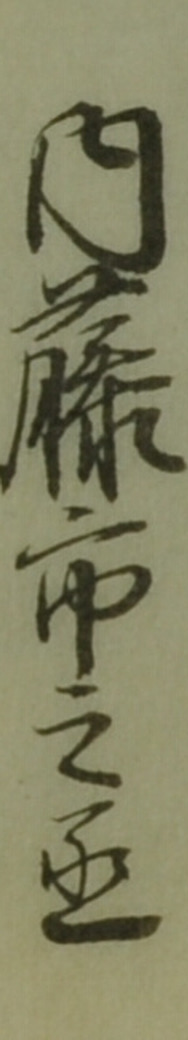内藤市之丞
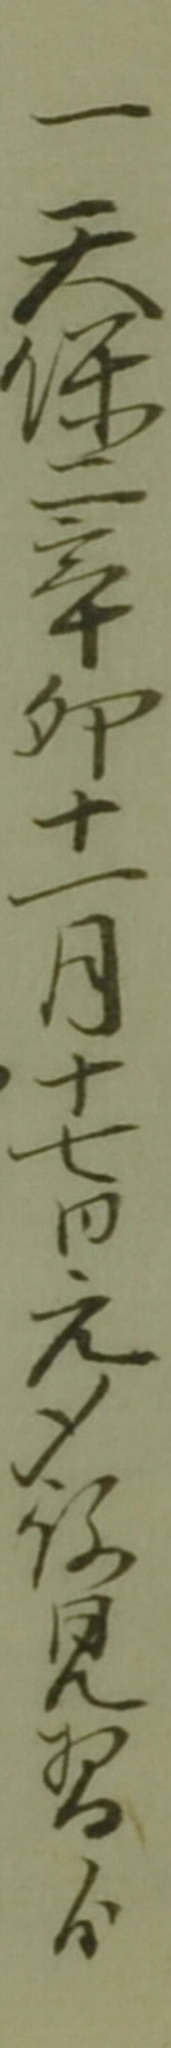一天保二辛卯十一月十七日元〆役見習ゟ
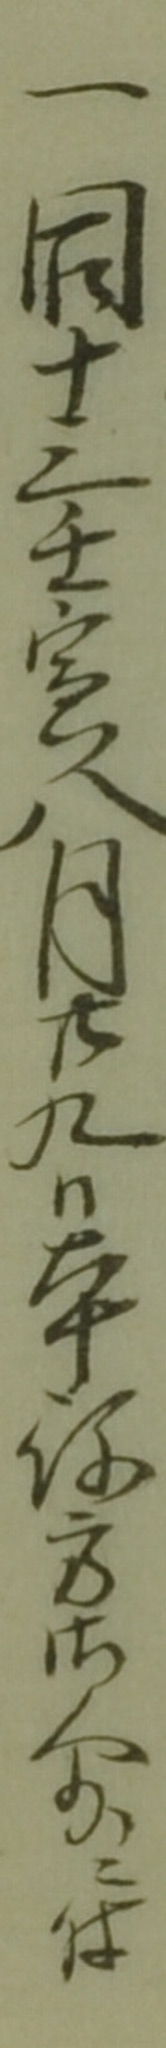一同十三壬寅八月廿九日本役方御人少付
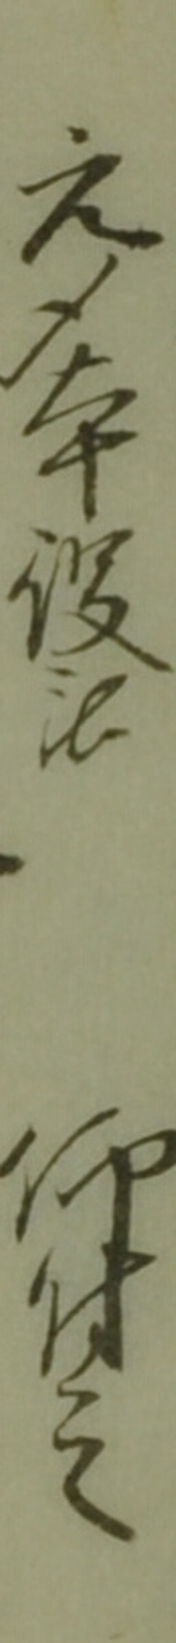元〆本役被仰付之
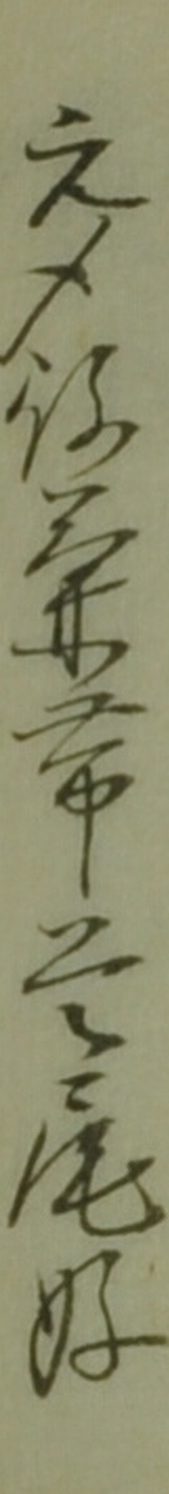元〆役兼帯首尾好
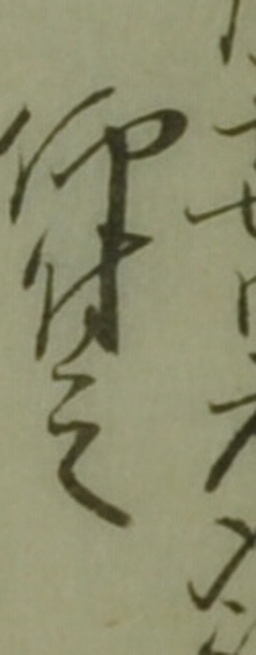仰付之
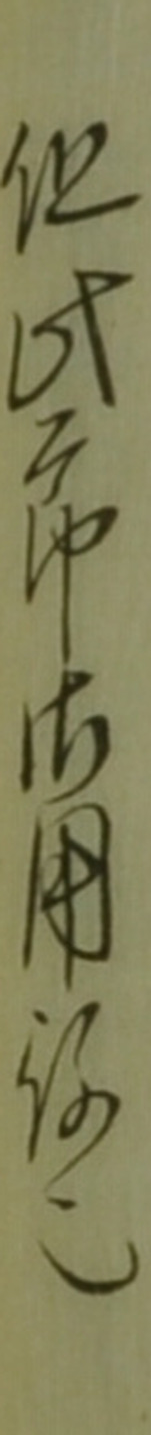但此節御用役也
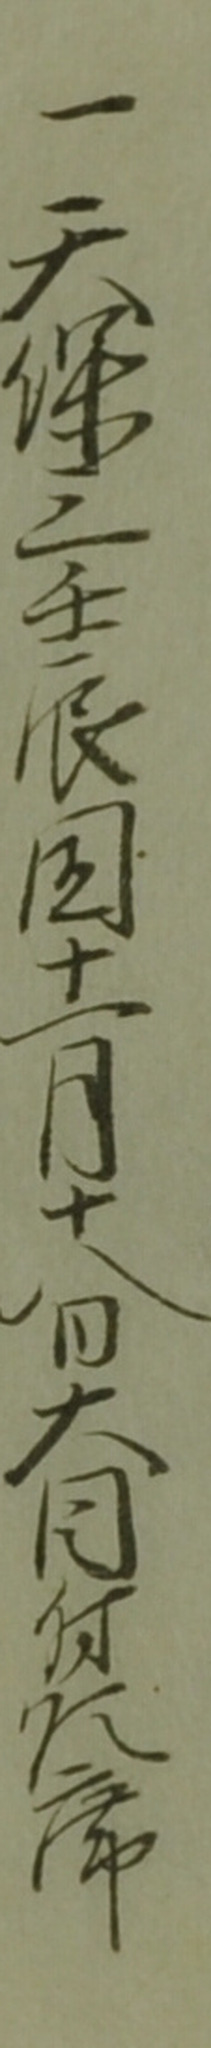一天保三壬辰閏十一月十八日大目付次席
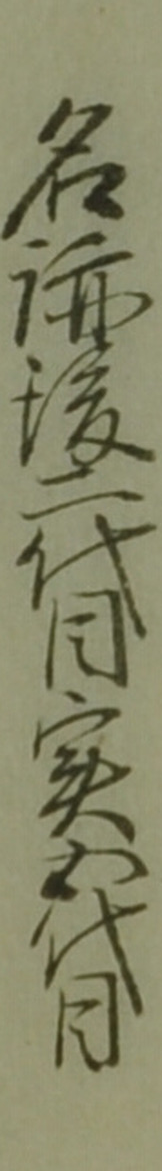名跡後二代目実五代目
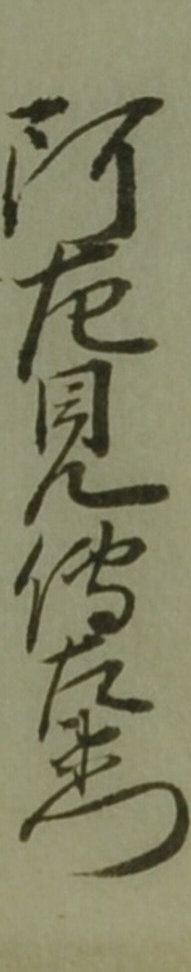阿左見伝左衛門
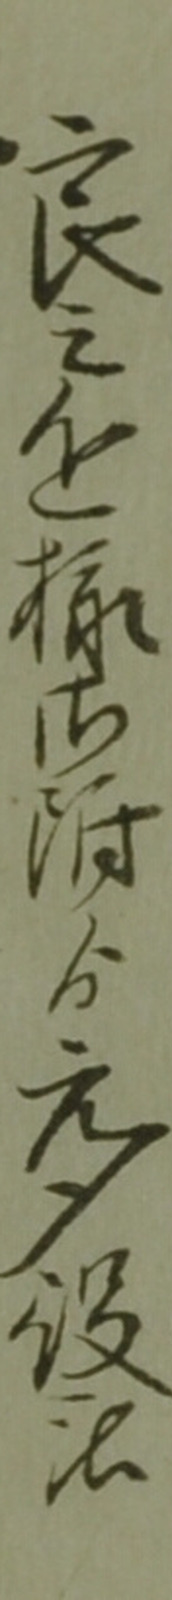良之進様御附ゟ元〆役被
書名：諸御役代々録（七）
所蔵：伊那市立高遠町図書館・合同会社AMANE
